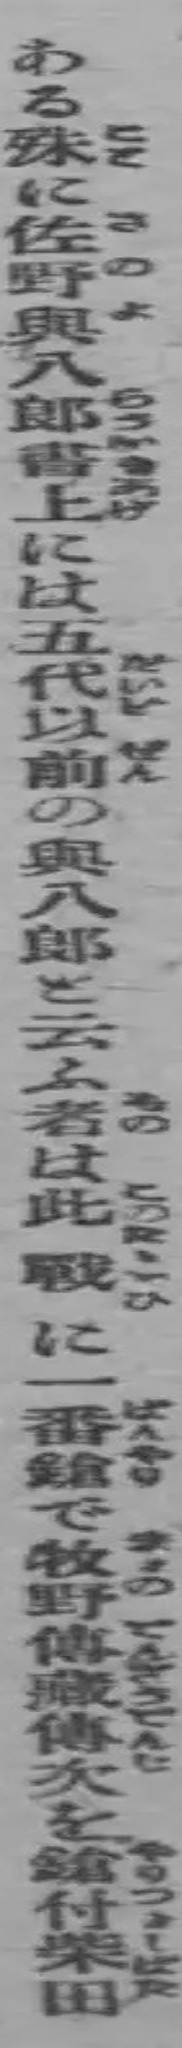ある殊に佐野與八郎書上には五代以前の與八郎と云ふ者は此戦に一番鎗で牧野伝蔵傳次を鎗付柴田
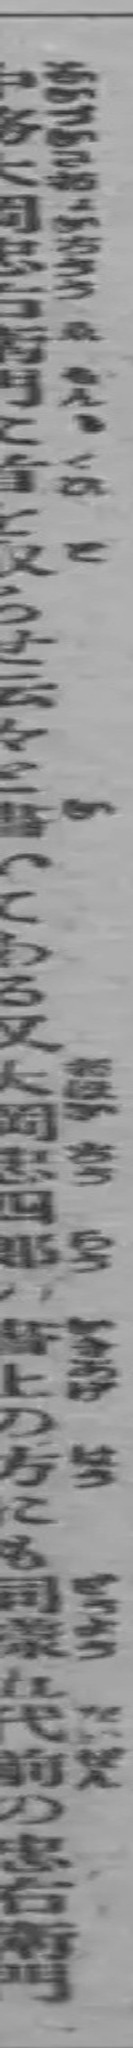中務大岡忠右衛門に首を取らせ云々と書いてある又大岡忠四郎の書上の方にも同様五代前の忠右衛門
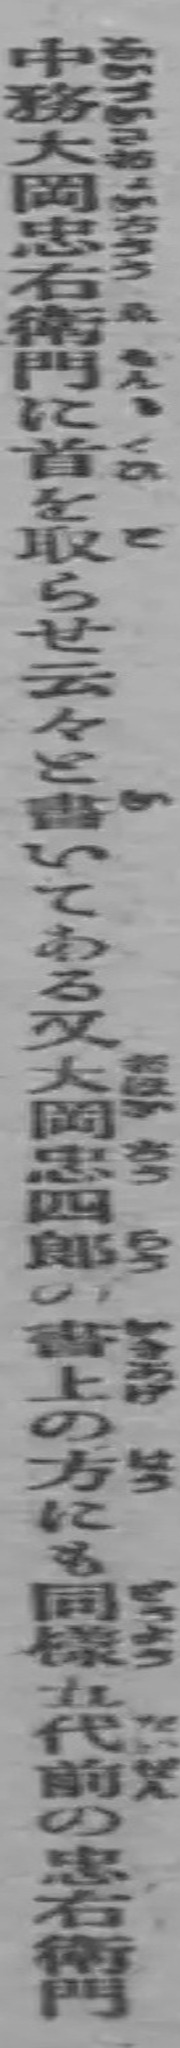中務大岡忠右衛門に首を取らせ云々と書いてある又大岡忠四郎の書上の方にも同様五代前の忠右衛門
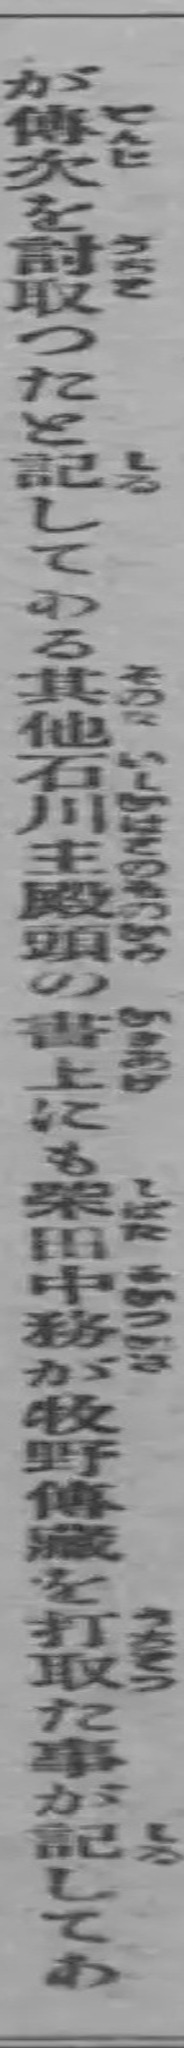が傳次を討取つたと記してある其他石川主殿頭の書上にも柴田中務が牧野傳蔵を打取た事が記してあ
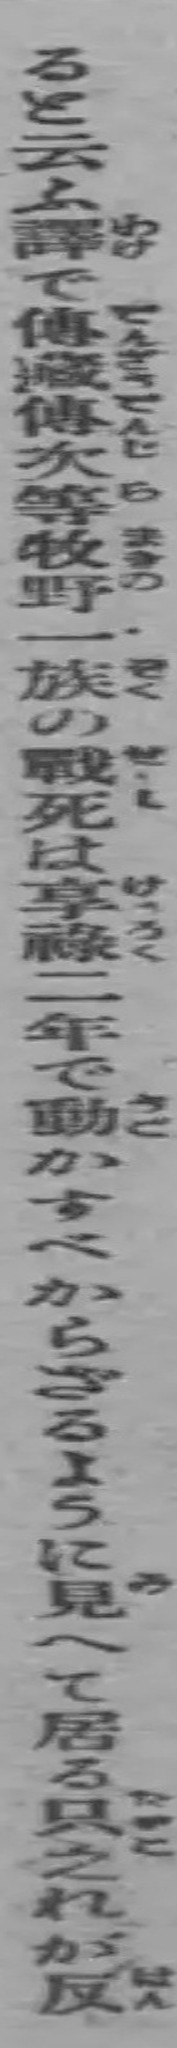古河系図ると云ふ訳で傳蔵傳次等牧野一族の戦死は享禄二年で動かすべからざるように見へて居る只之れが反
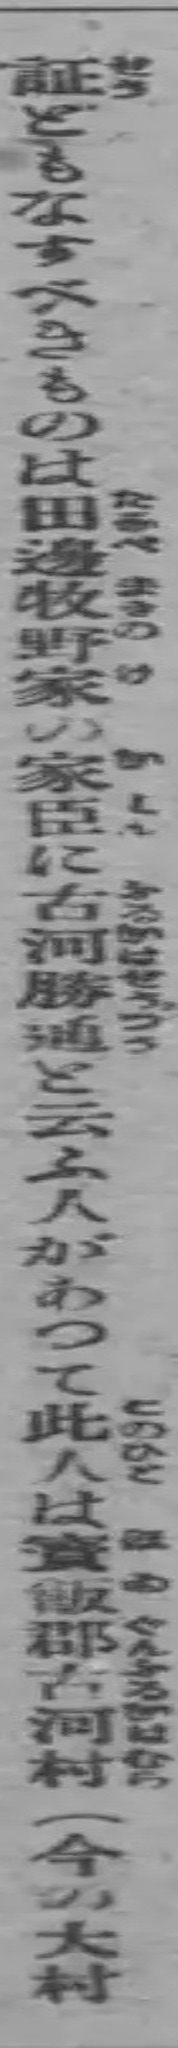証ともなすべきものは田辺牧野家の家臣に古河勝通と云ふ人があつて此人は宝飯郡古河村(今の大村
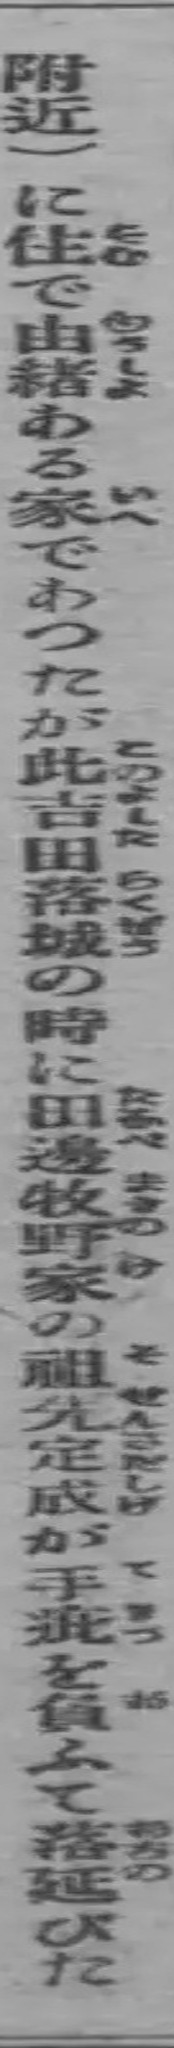附近)に住で由緒ある家であつたが此吉田落城の時に田辺牧野家の祖先定成が手疵を負ふて落延びた
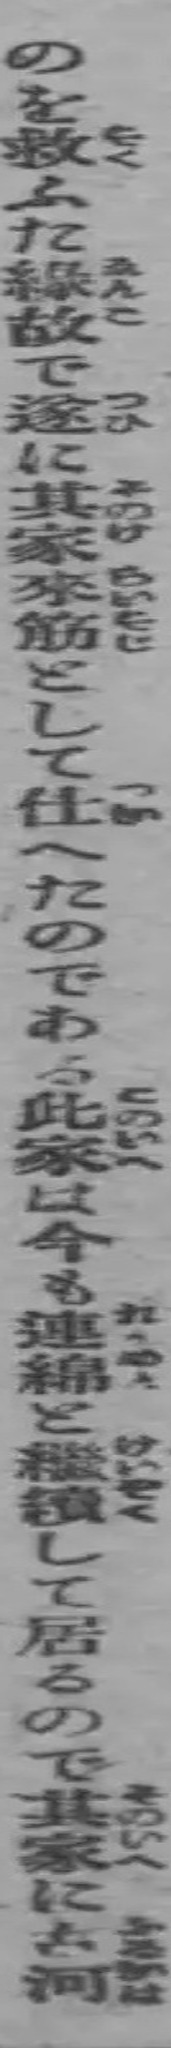のを救ふた縁故で遂に其家来筋として仕へたのである此家は今も連綿と継続して居るので其家に古河
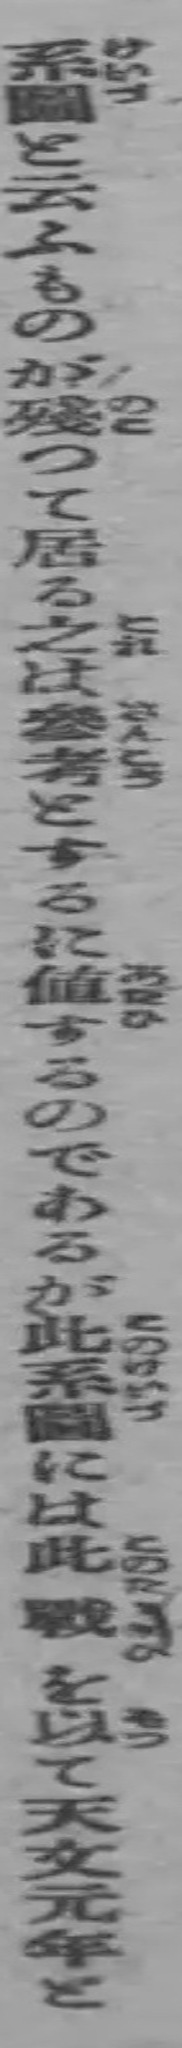系図と云ふものが残つて居る之は参考とするに値するのであるが此系図には此戦を以て天文元年と
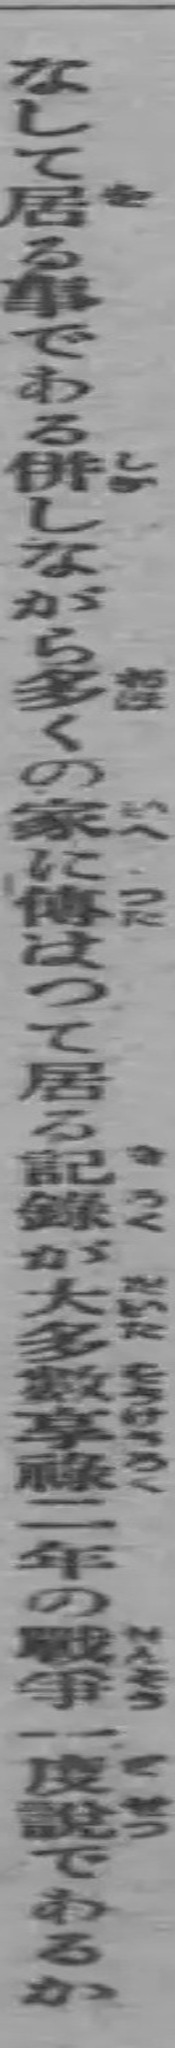なして居る事である併しながら多くの家に伝はつて居る記録が大多数享禄二年の戦争一度説であるか
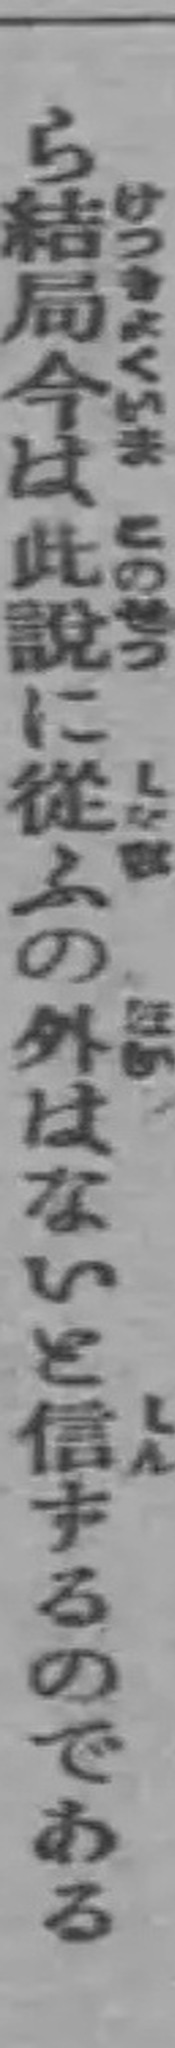ら結局今は此説に従ふの外はないと信ずるのである
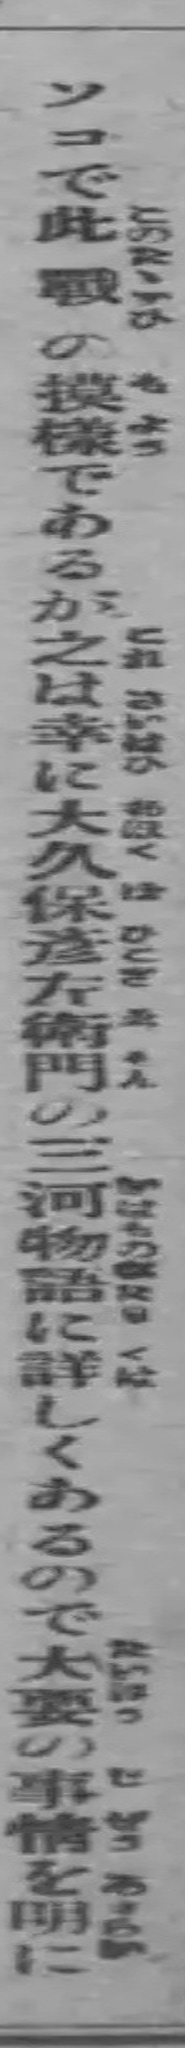戦の状況ソコで此戦の模様であるが之は幸に大久保彦左衛門の三河物語に詳しくあるので大要の事情を明に
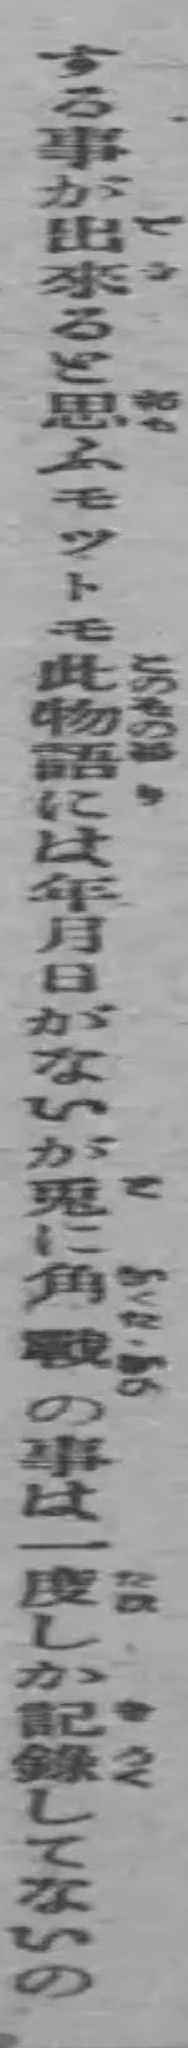する事が出来ると思ふモツトモ此物語には年月日がないが兎に角戦の事は一度しか記録してないの
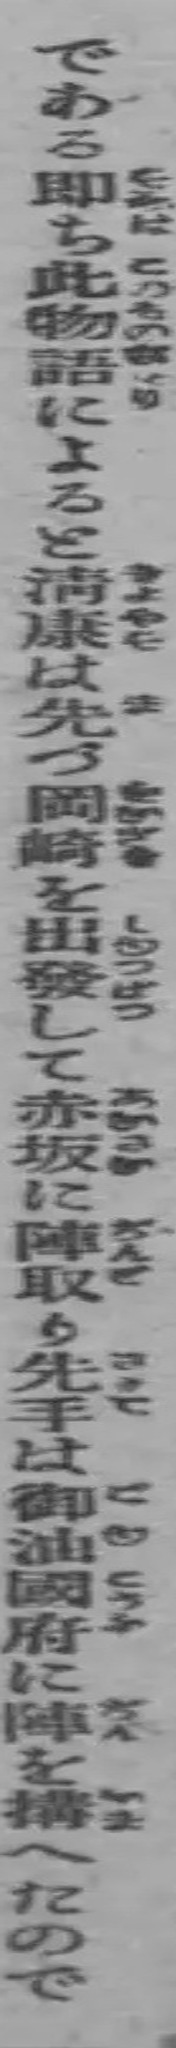である即ち此物語によると清康は先づ岡崎を出発して赤坂に陣取り先手は御油国府に陣を構へたので
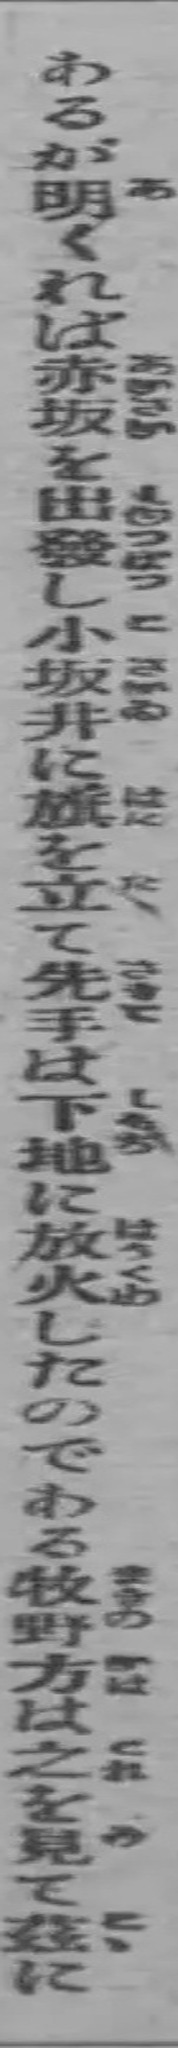あるが明くれば赤坂を出発し小坂井に旗を立て先手は下地に放火したのである牧野方は之を見て茲に
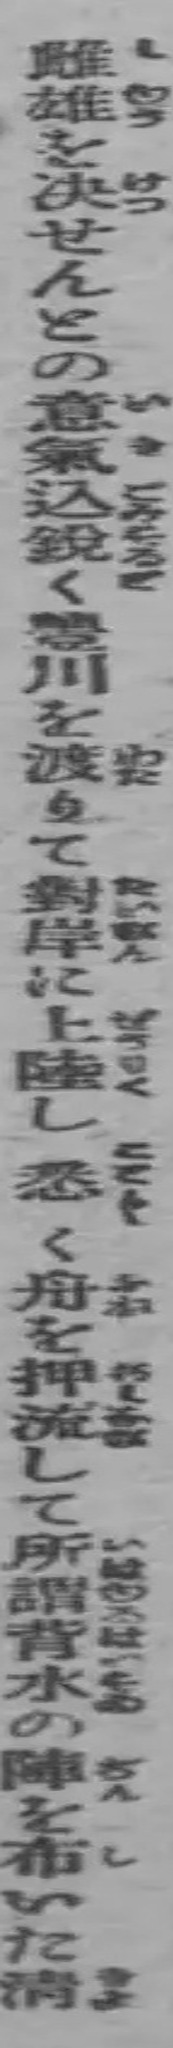雌雄を決せんとの意気込鋭く豊川を渡りて対岸に上陸し悉く舟を押流して所謂背水の陣を布いた清
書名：豊橋市史談
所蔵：国立国会図書館 National Diet Library, JAPAN
